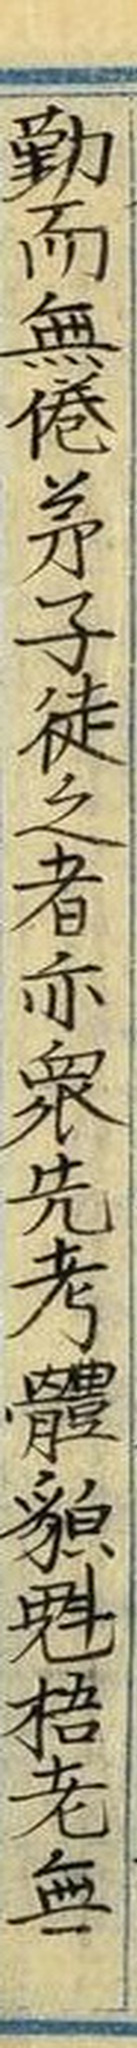勤而無倦弟子徒之者亦衆先考體貌魁梧老無
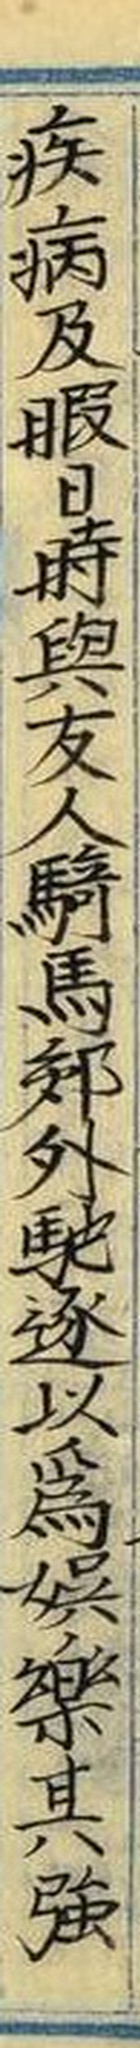疾病及暇日時與友人騎馬郊外馳逐以爲娯樂其強

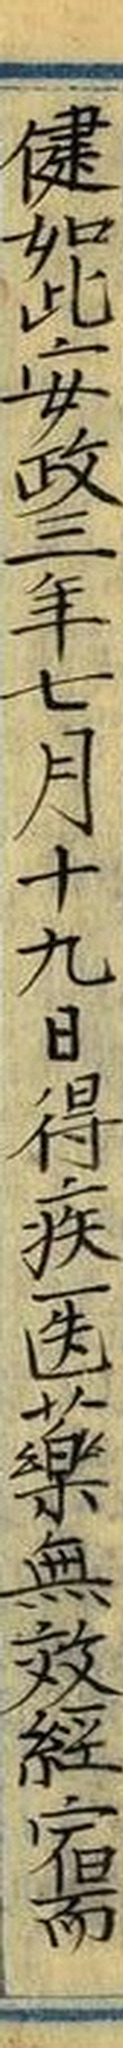健如此安政三年七月十九日得疾医藥無效經宿而
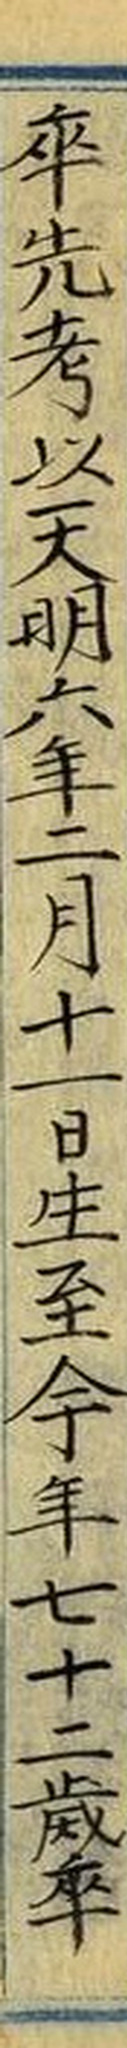卒先考以天明六年二月十一日生至今年七十二歳卒
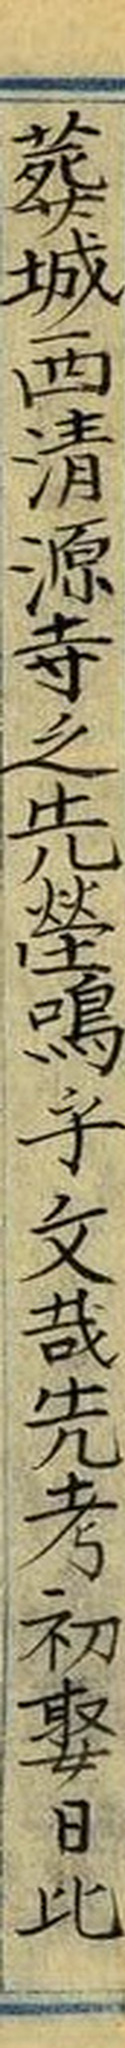葬城西清源寺之先塋嗚乎文哉先考初娶日比
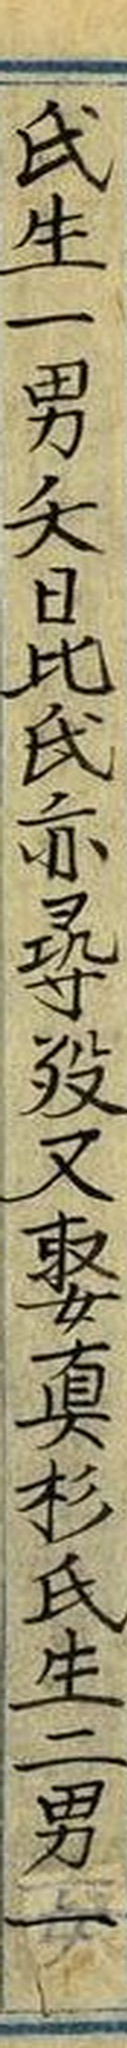氏生一男夭日比氏亦尋殁又娶眞杉氏生二男一
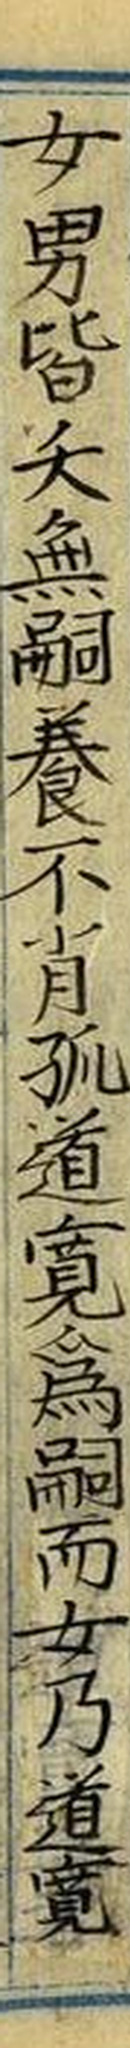女男皆夭無嗣養不肖孤道寛爲嗣而女乃道寛
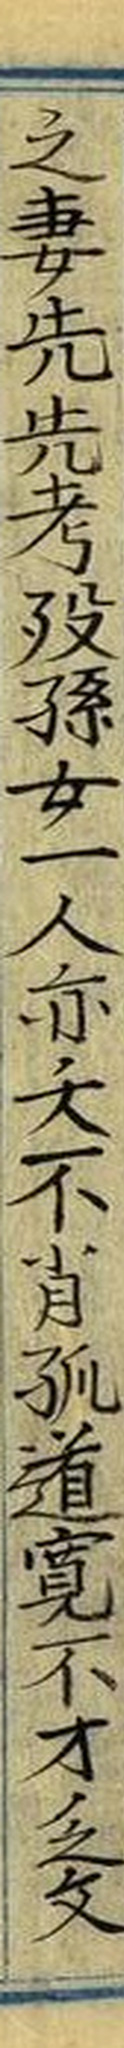之妻先先考殁孫女一人亦夭不肖孤道寛不才乏文
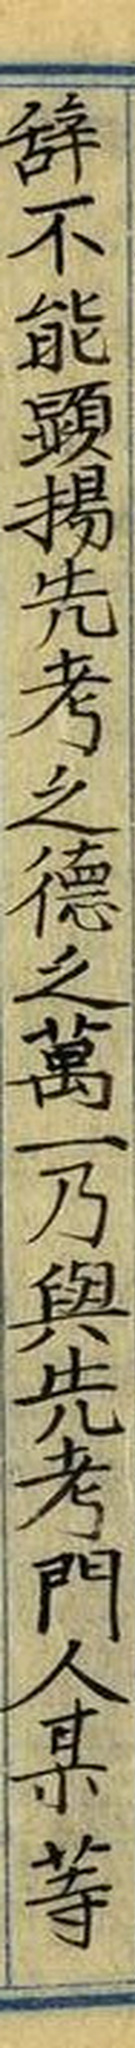辞不能顕揚先考之德之萬一乃與先考門人某等
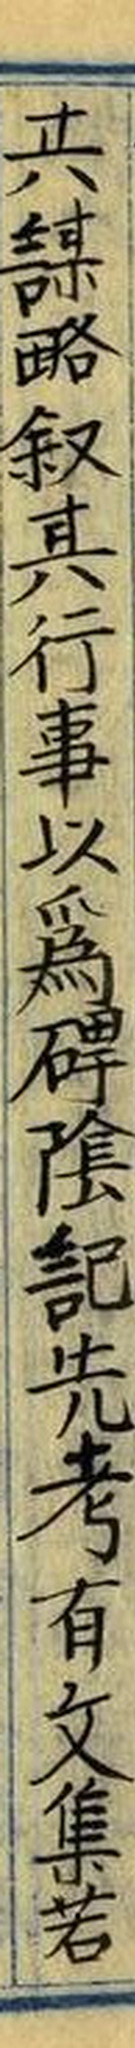共謀略叙其行事以爲碑隂記先考有文集若
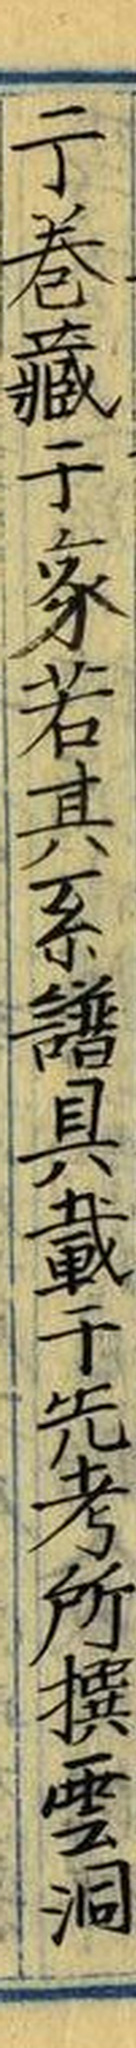亍巻藏于家若其系譜具載于先考所撰雲洞
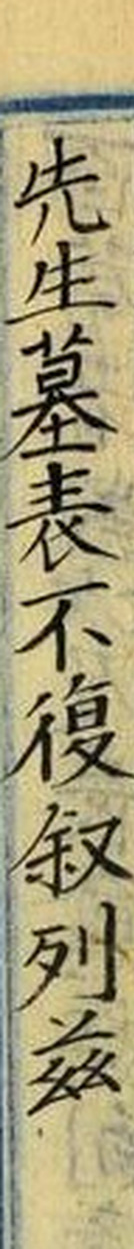先生墓表不復叙列兹
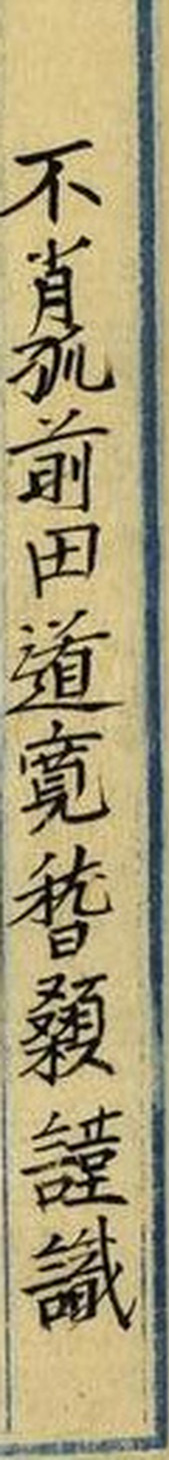不肖孤前田道寛顙謹識
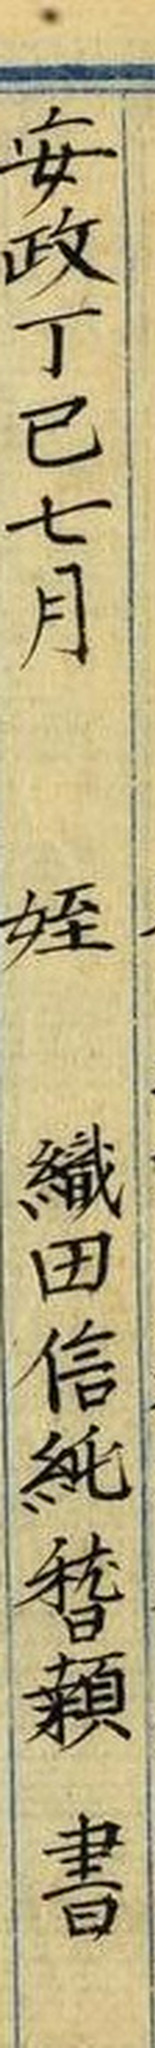安政丁巳七月姪織田信純䫙書

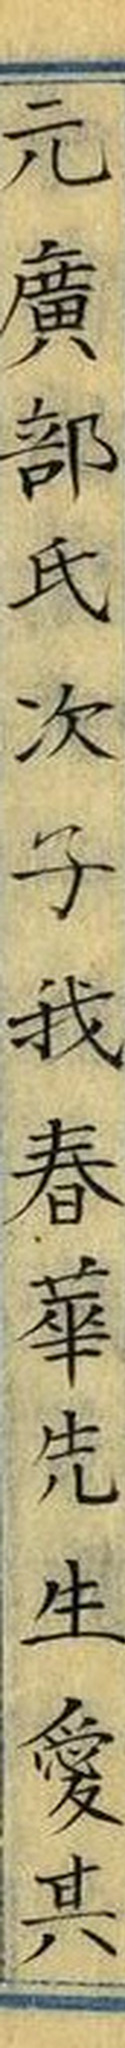元廣部氏次子我春蕐先生愛其
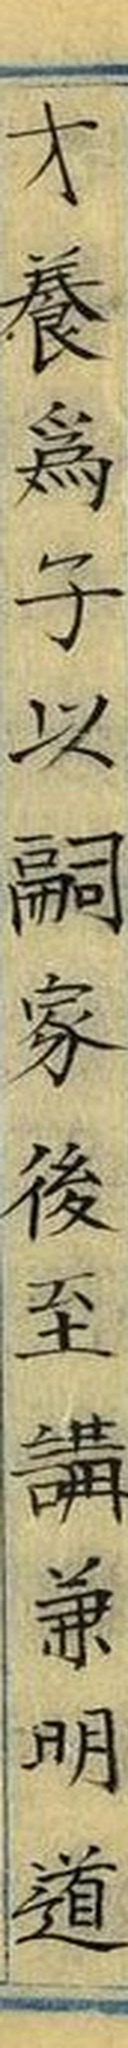才養爲子以嗣家後至講兼明道
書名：温古集 四巻
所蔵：福井県文書館 Fukui Prefectural Archives
